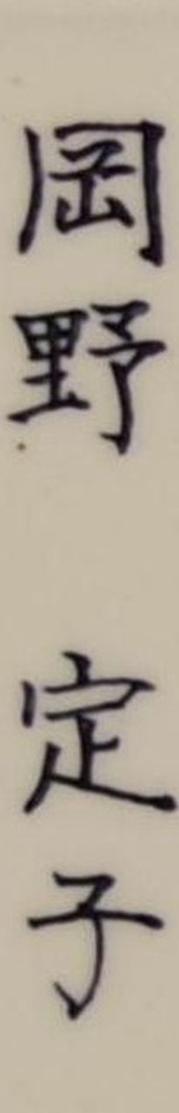岡野定子
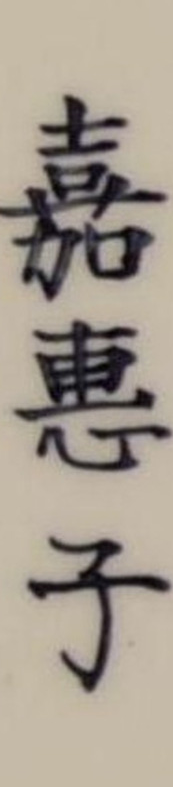嘉恵子
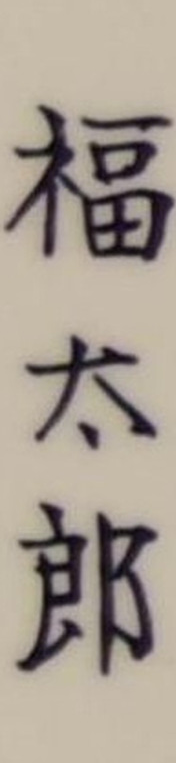福太郎

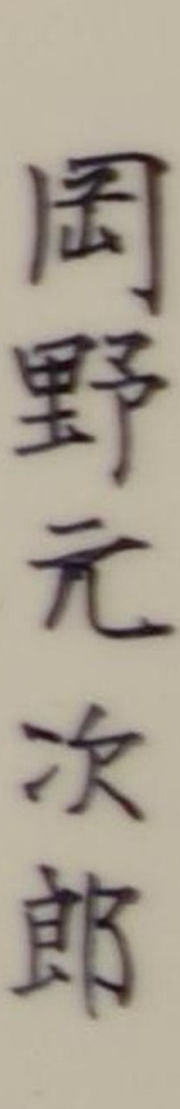岡野元次郎
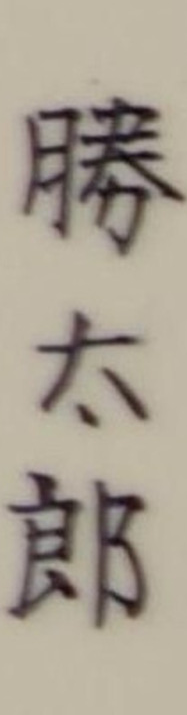勝太郎
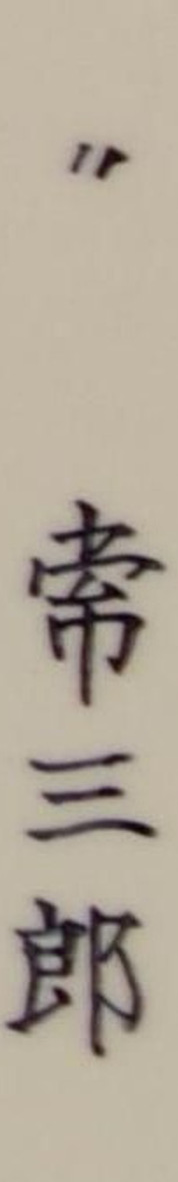常三郎
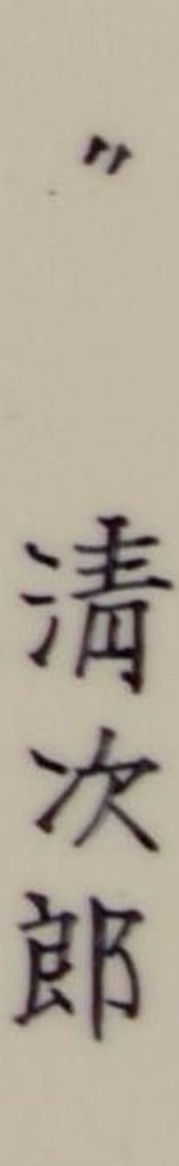清次郎
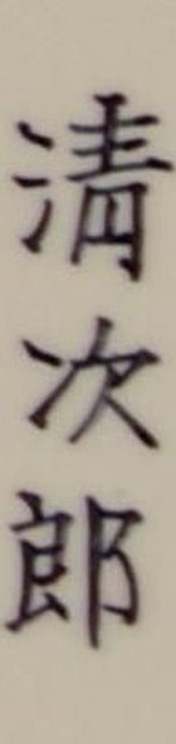清次郎
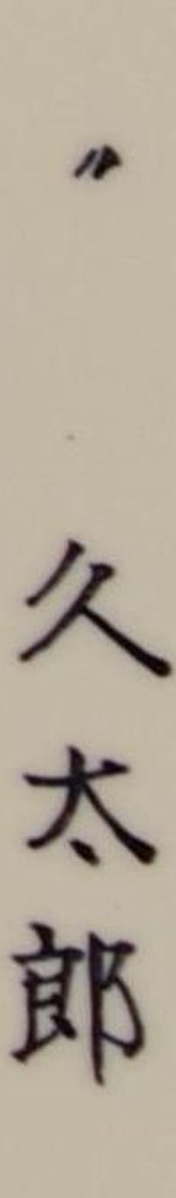久太郎
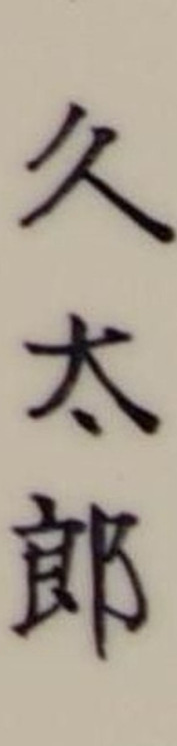久太郎
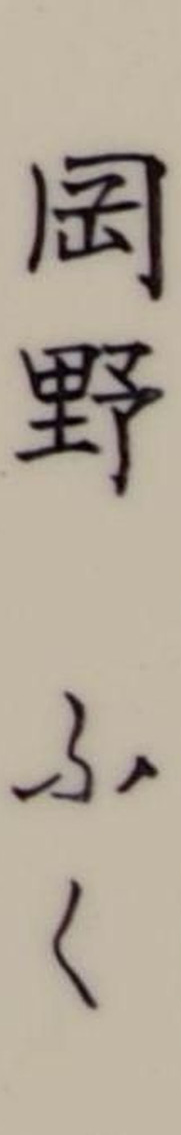岡野ふく
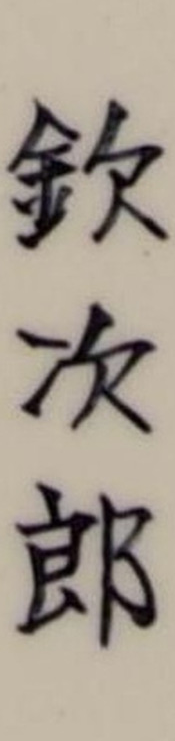清次郎
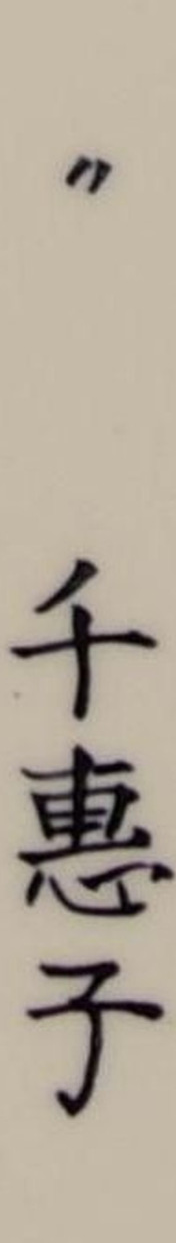千恵子
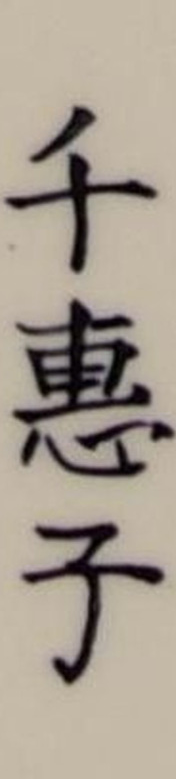千恵子
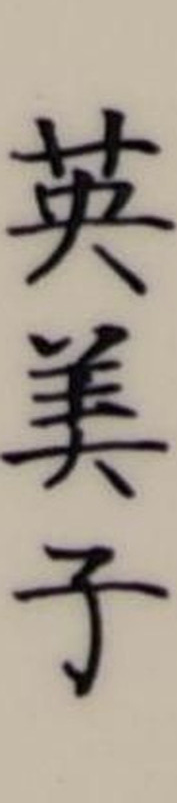英美子
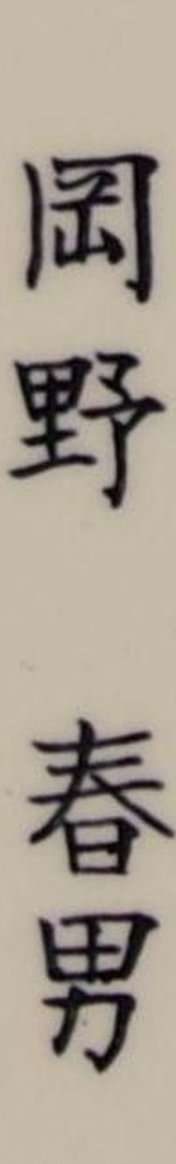岡野春男
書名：E~L
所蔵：高野山金剛峯寺
